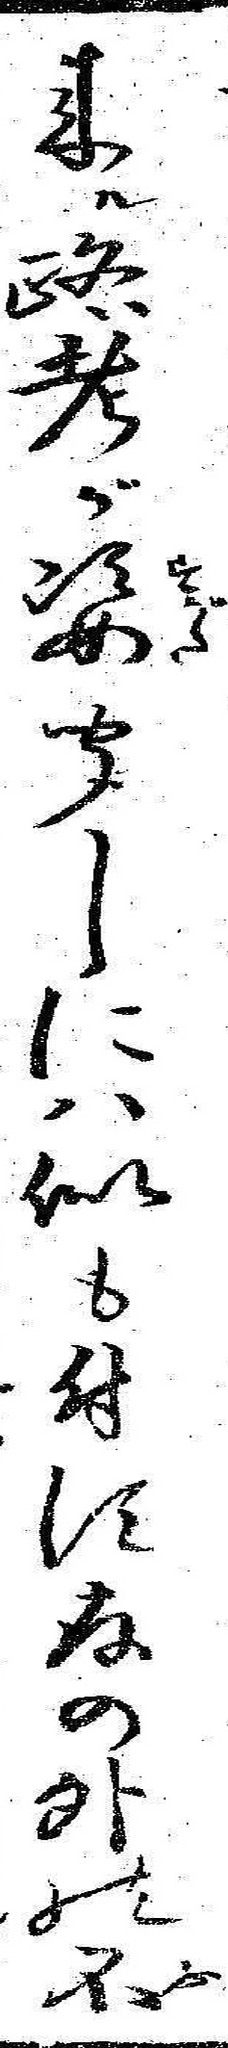来路考が姿聞しには似も付す存の外の不
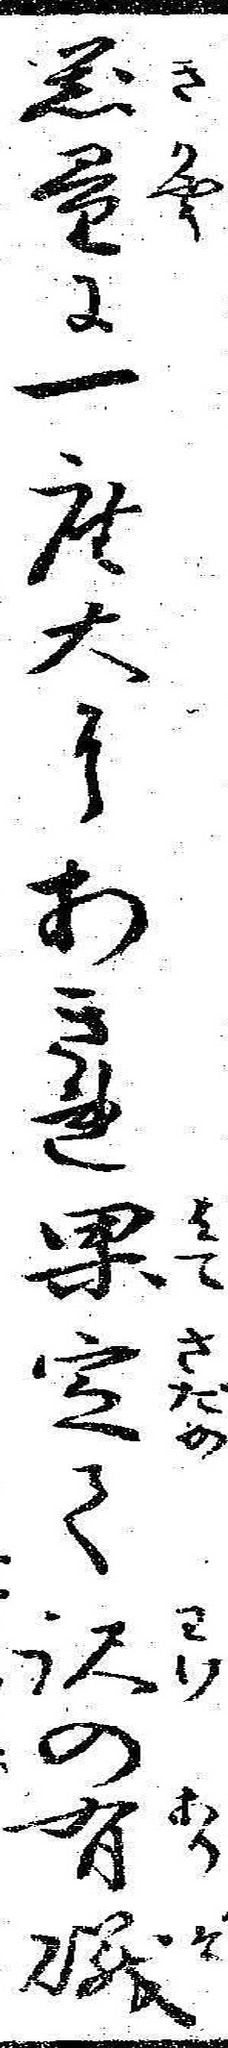器量に一座大にあきれ果定て訳の有磯
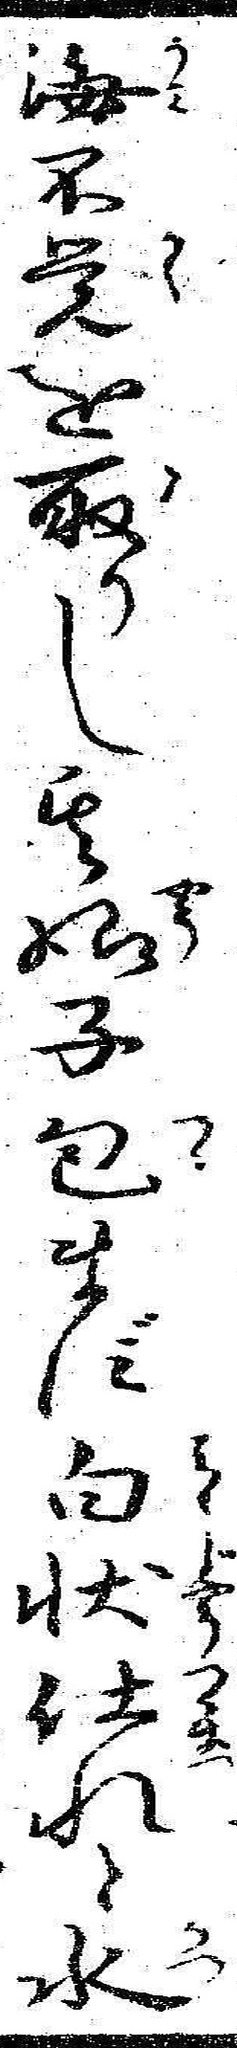海不覚を取りし其様子包まず白状仕れと水
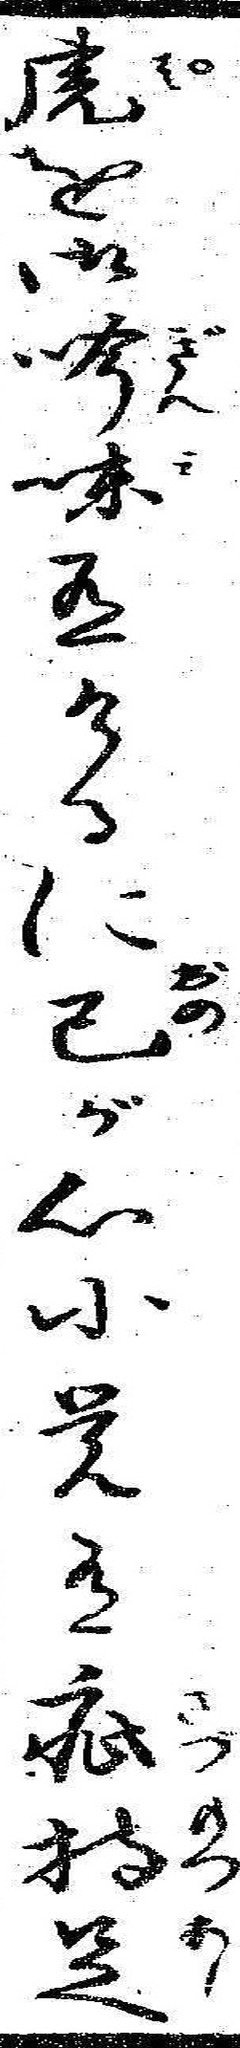虎を御吟味有けるに己が心に覚有疵持足
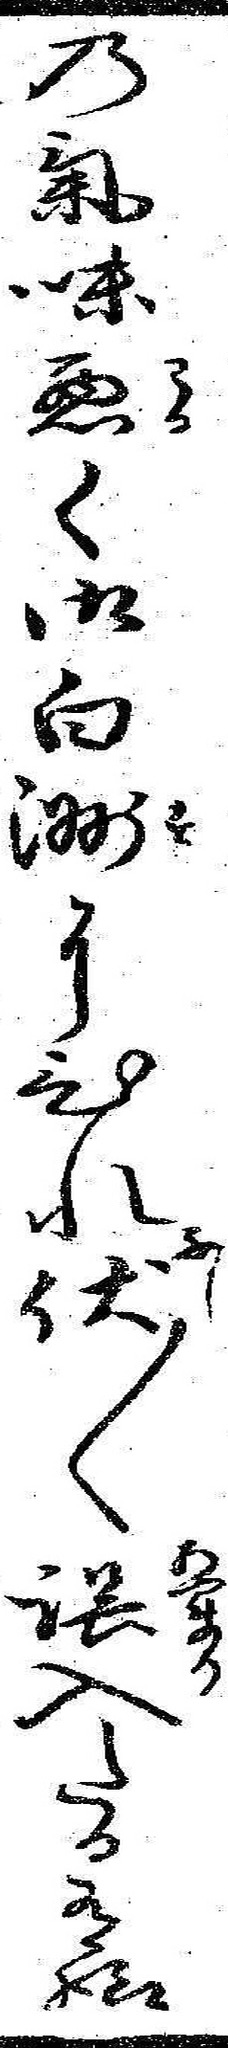の気味悪く御白洲にひれ伏〱誤入たる有様
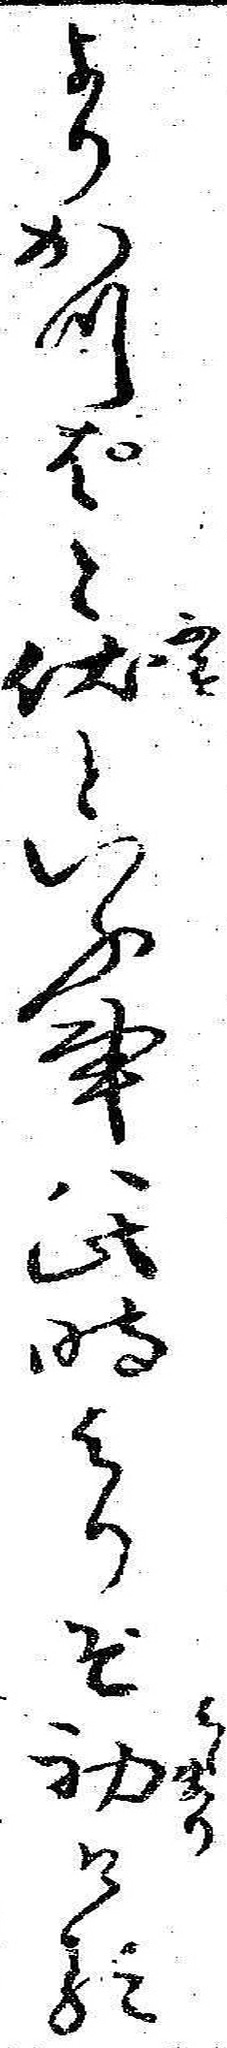よりかつぱと伏といふ事は此時よりぞ初ける
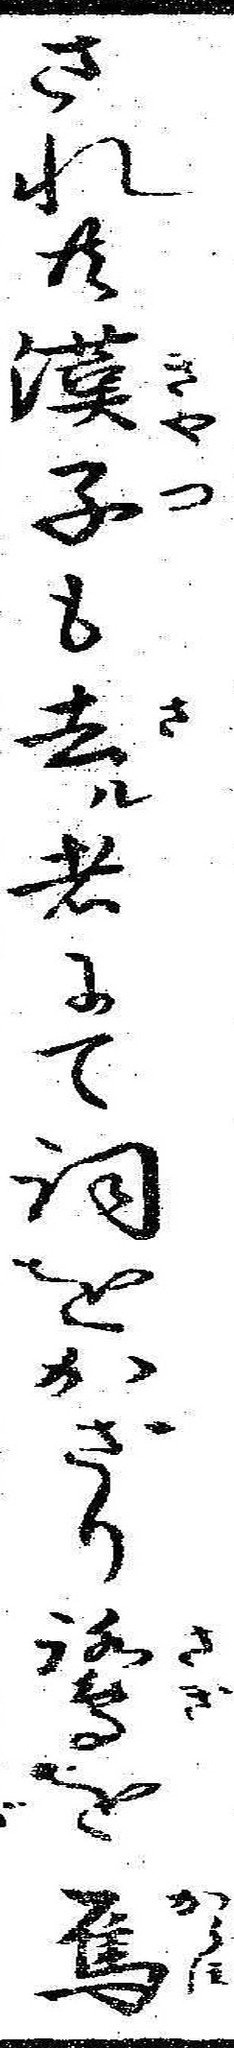され共漢子も去者にて詞をかざり鷺を烏
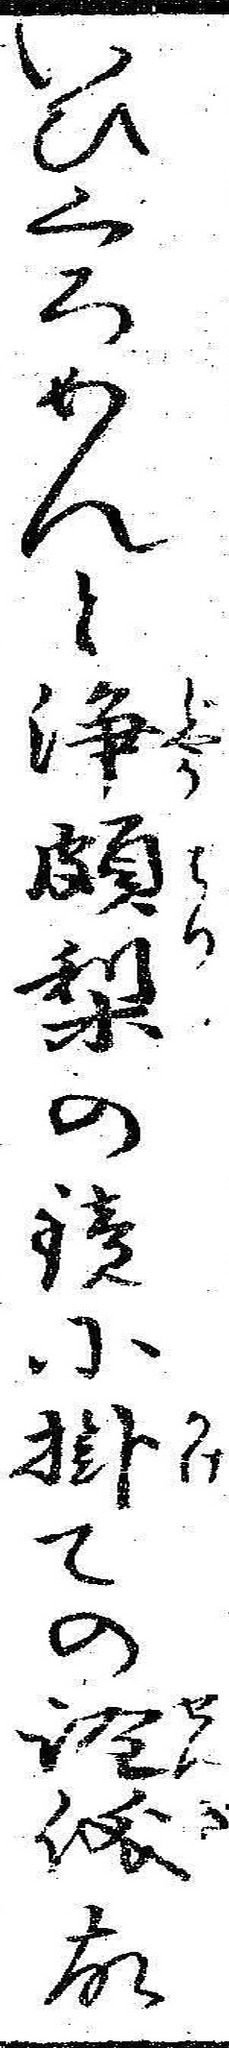いひくろめんと浄頗梨の鏡に掛ての詮議故
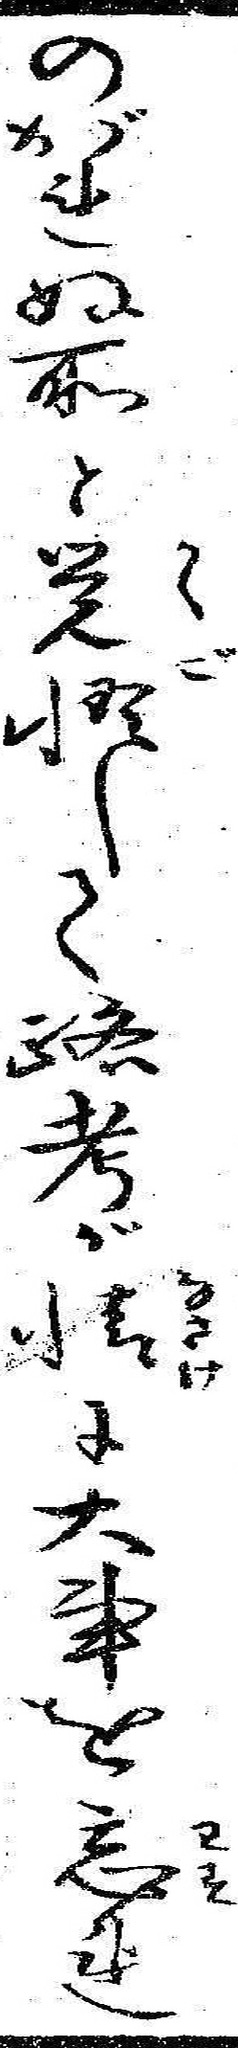のがれぬ所と覚悟して路考が情に大事を忘れ
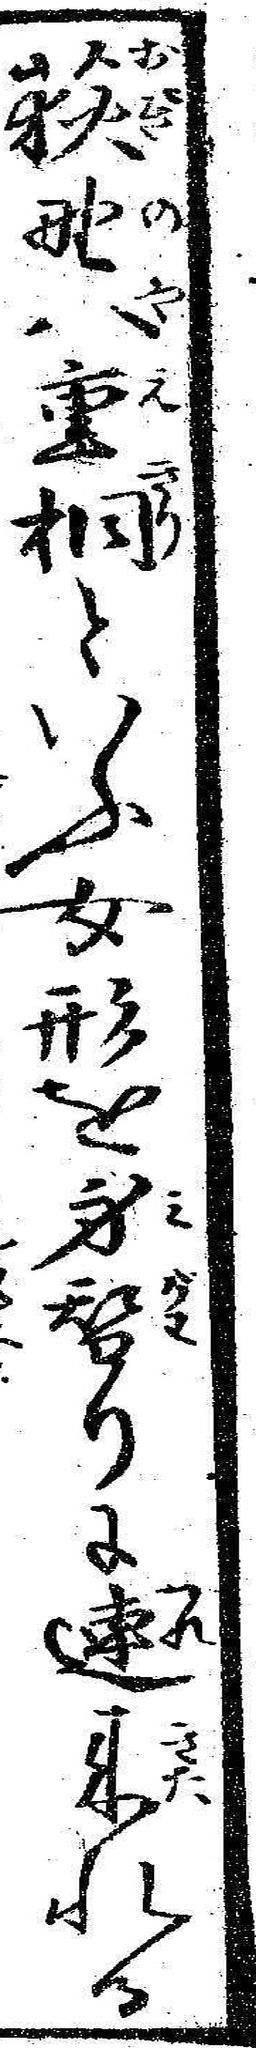萩野八重桐といふ女形を身替りに連来れる
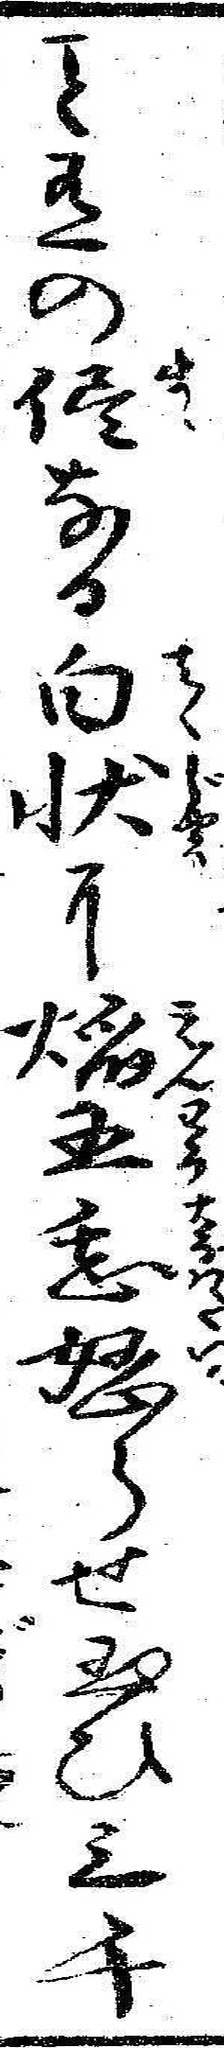こと有の儘なる白状に焔王甚怒らせ玉ひ三千
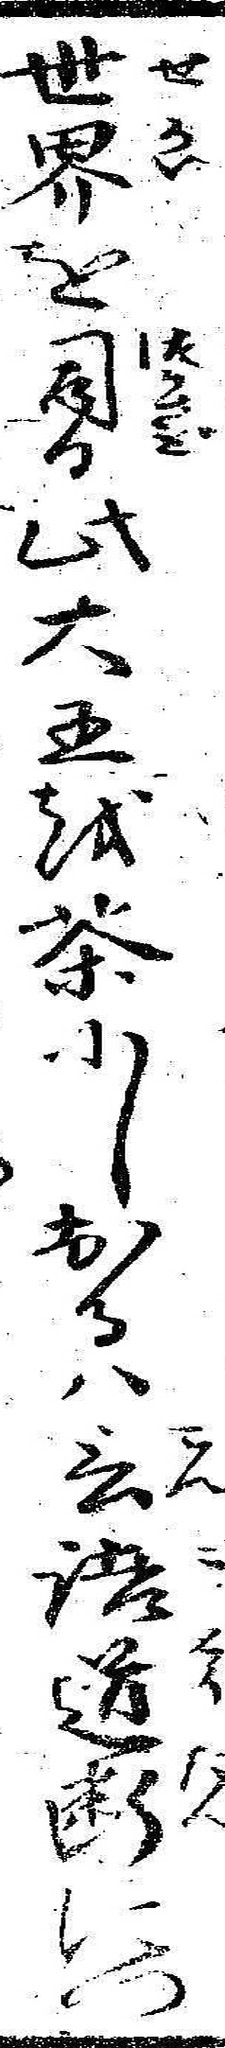世界を司る此大王を茶にしおるは言諸道断につ
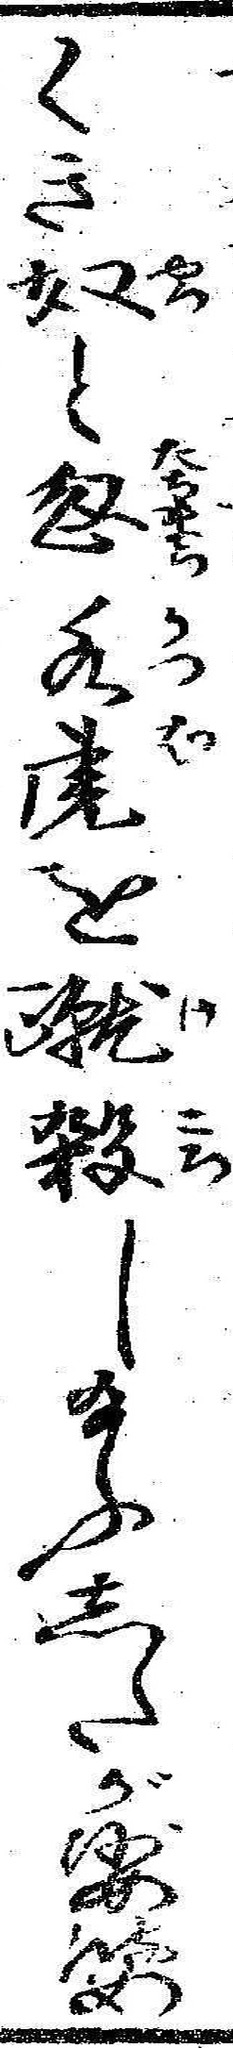くき奴と忽水虎を蹴殺し給ふしたが娑婆
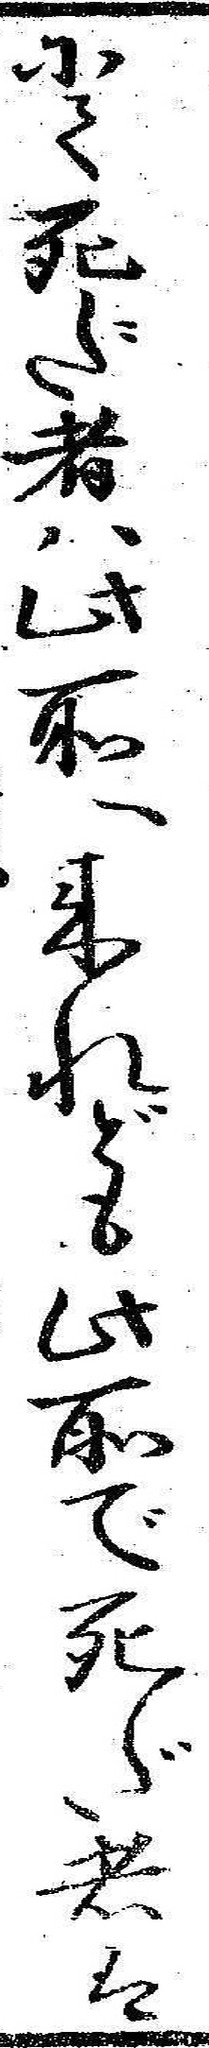にて死だ者は此所へ来れども此所で死だ者は
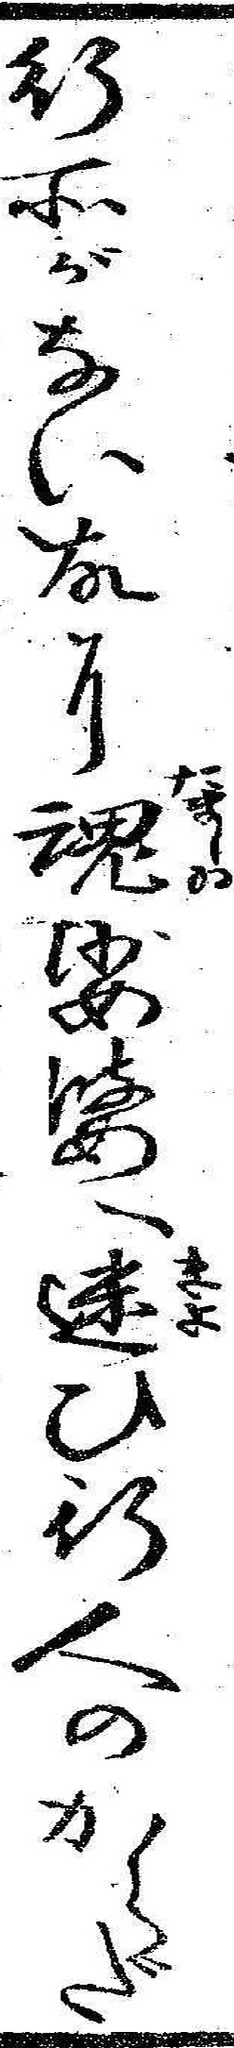行所がない故に魂娑婆へ迷ひ行人のからだ
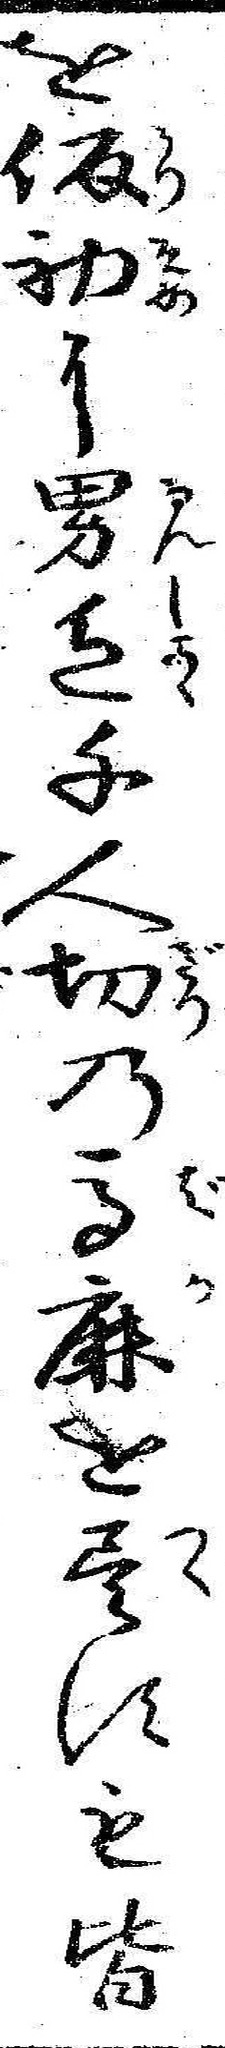を仮初に男色千人切の馬鹿を尽すも皆
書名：根無草後編
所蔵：国文学研究資料館
